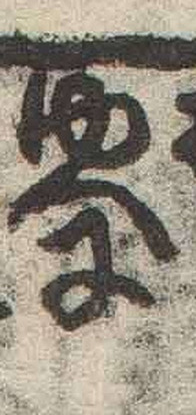ゆへに
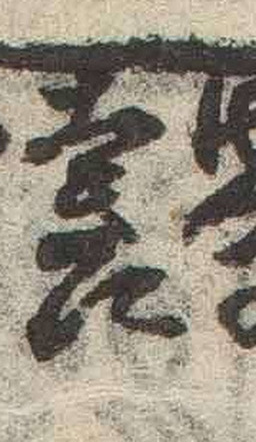大きに
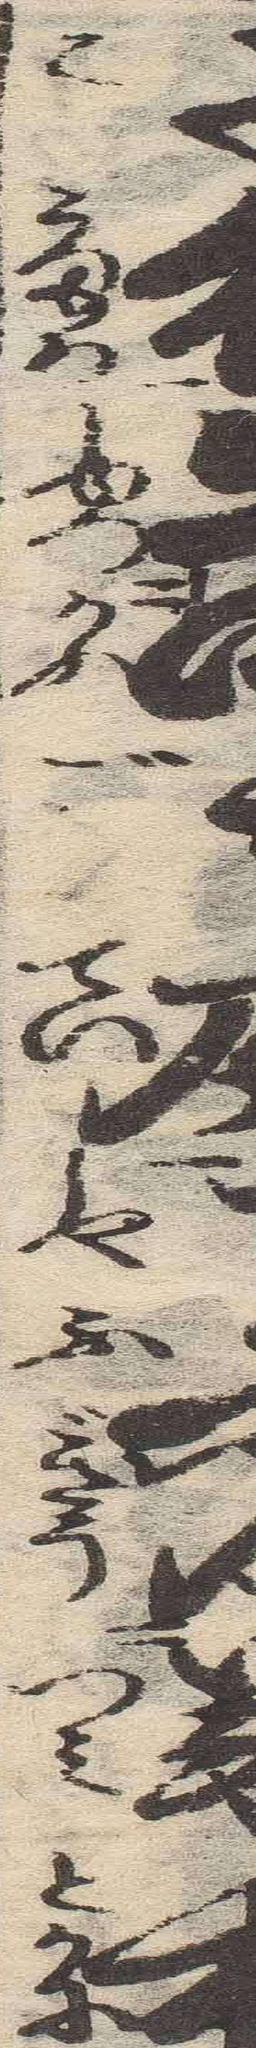ここまかしゆつかふごていしやふぎうつみとかに
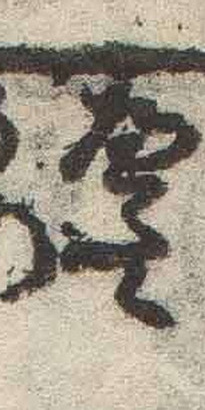へたて
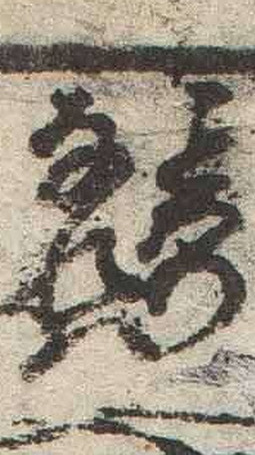なれは
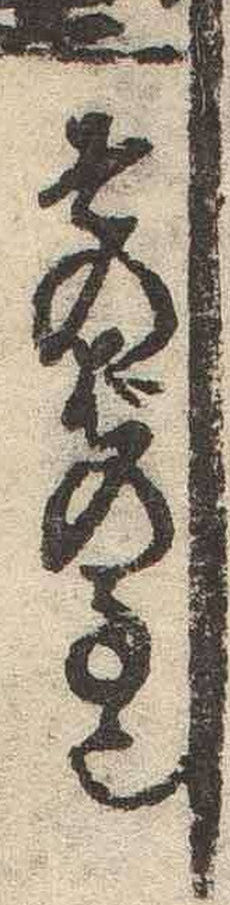其庭そのばの事也
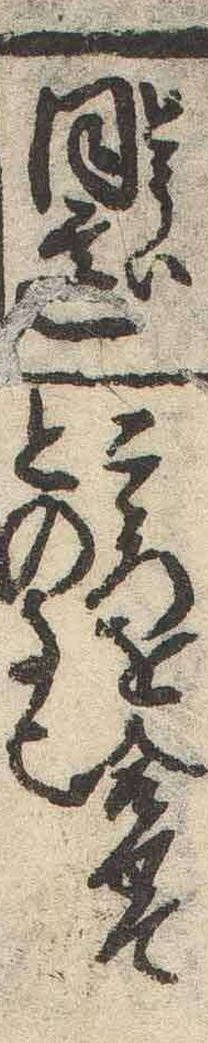同意こゝろを合せて
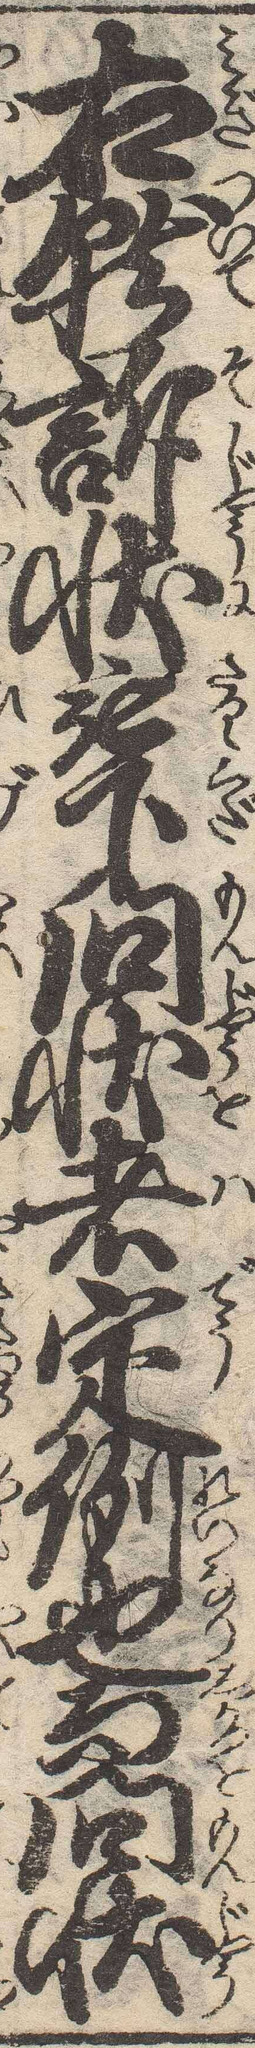右就訴状被下問状者定例也而問状
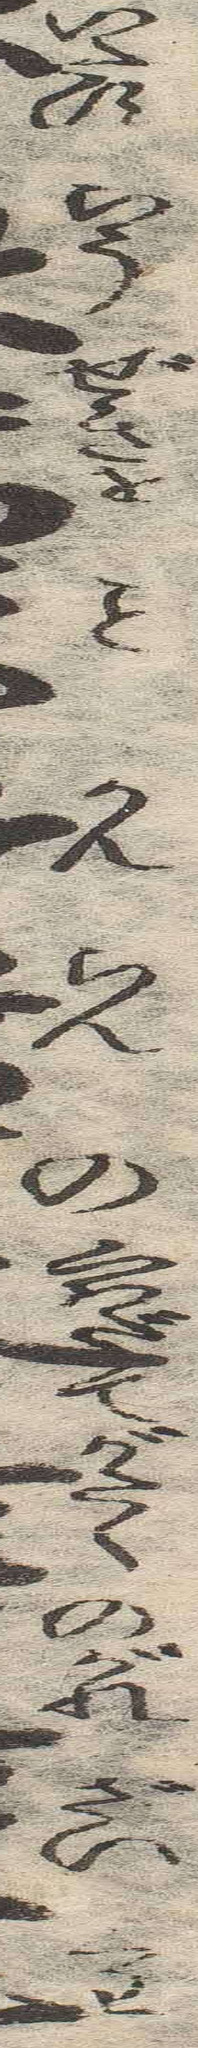いたすらうぜきをことかんらんのくはだてがたくのがれざいくわ
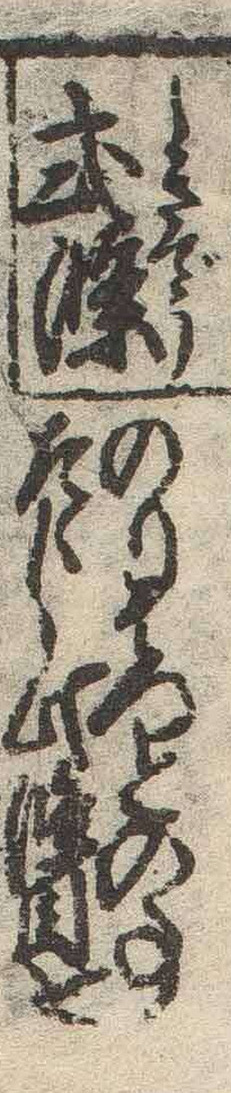式條のりはつとの事
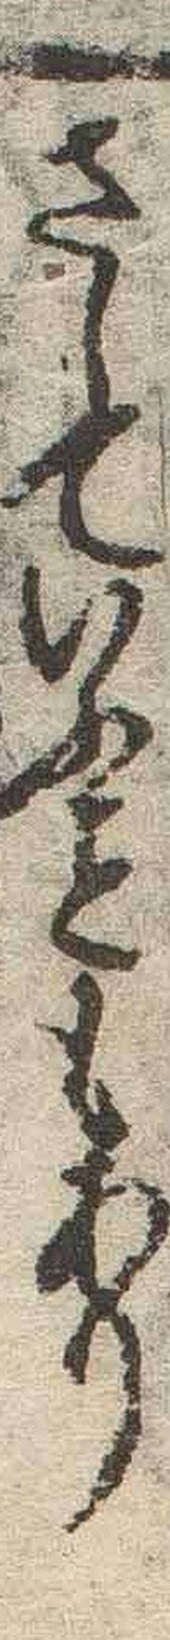さしていふこともあり
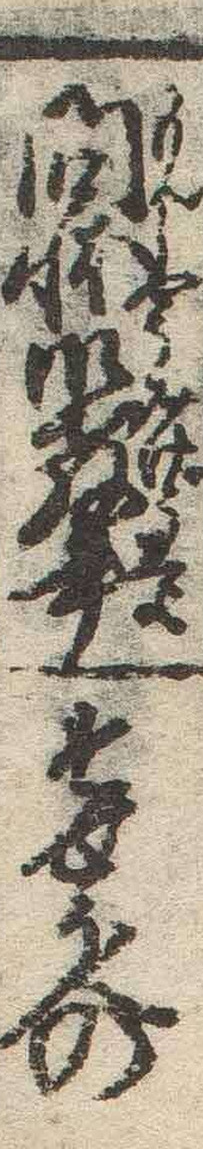問状御教書そせう人の
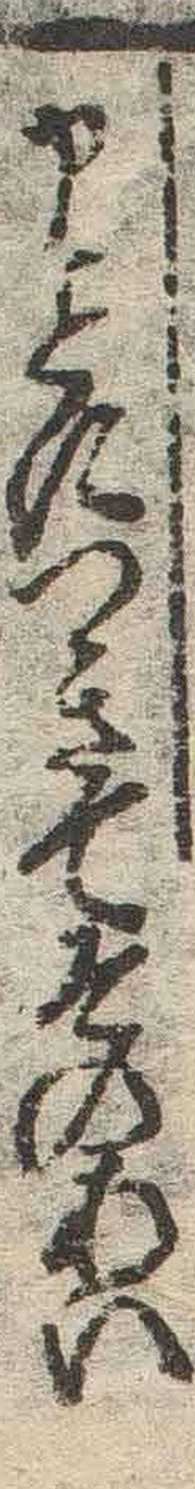申ことにつきてそのあい
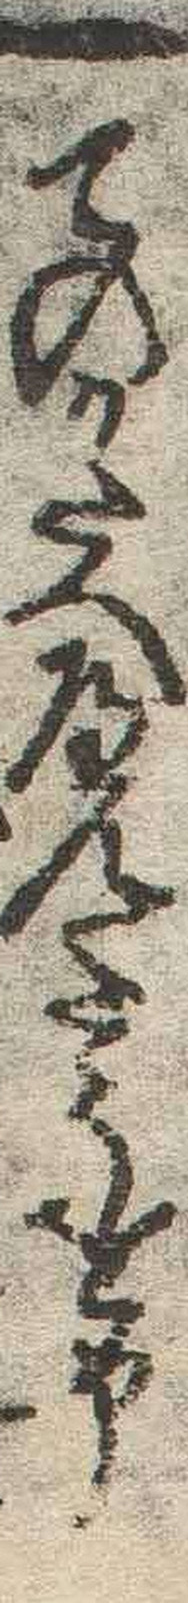てのかたへへんたうを申
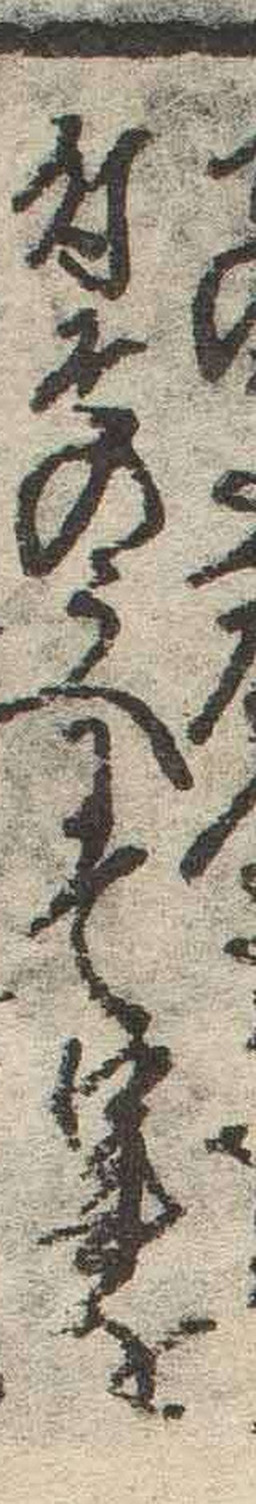付そのうへにて申事を
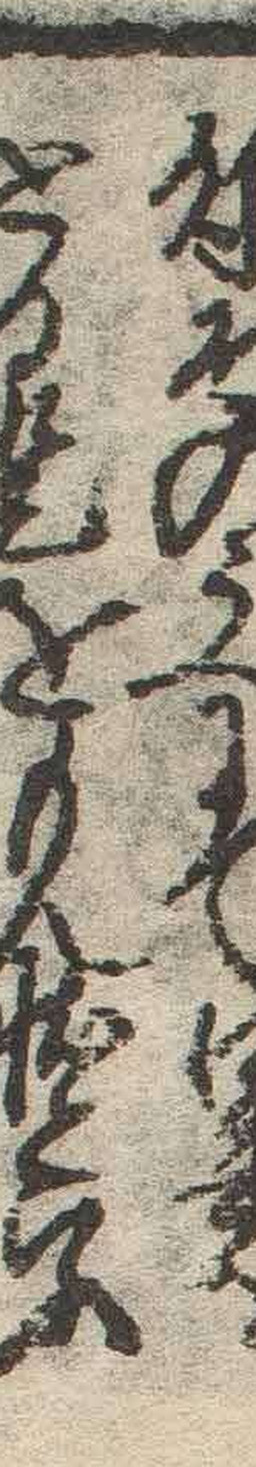とる是をもん状といふ
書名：御成敗式目絵抄
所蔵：東京学芸大学附属図書館 国文学研究資料館
